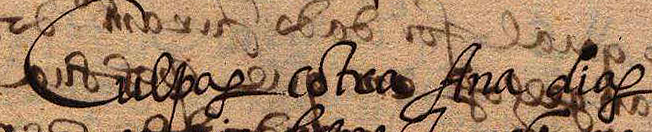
Culpas cōtra Ana dias
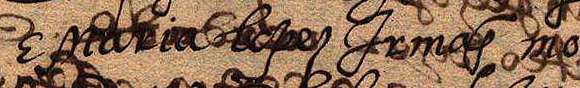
E Maria lopez Jrmas̄ mo
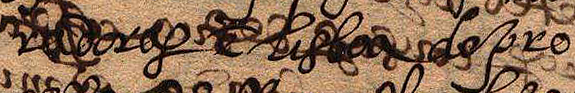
radoras ē lisboa do pro
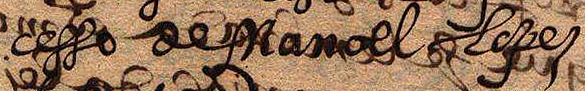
cesso de Manoel lopez
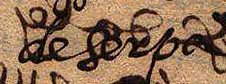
de serpa
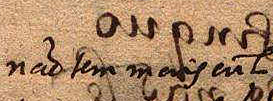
naõ tem mais cul
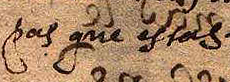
pas que estas.
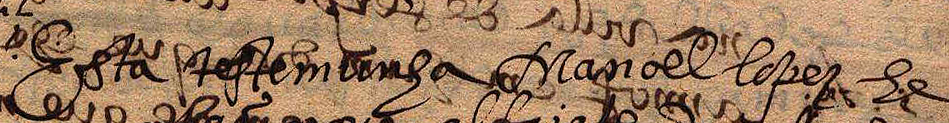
Esta testemunha Manoel lopez he
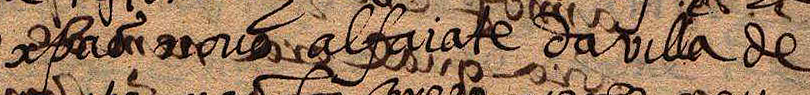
xpaõ nouo alfaiate da villa de
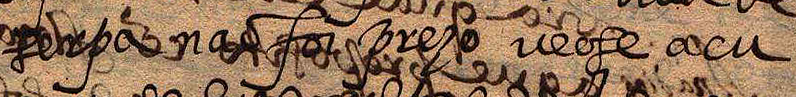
serpa naõ foi prezo ueose acu
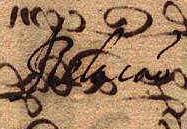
Relaçaõ
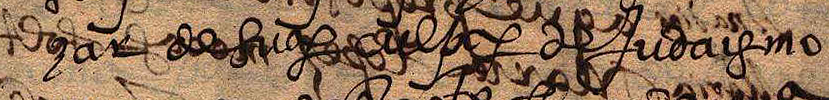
zar de suas culpas de Judaismo
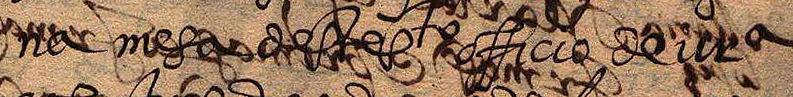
na mesa deste sto officio deura
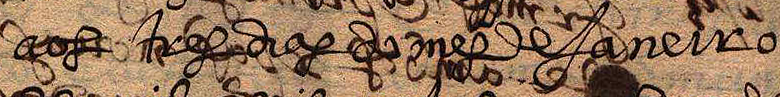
aos tres dias do mes de Janeiro
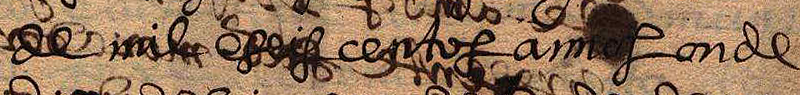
de mil e seiscentos annos onde
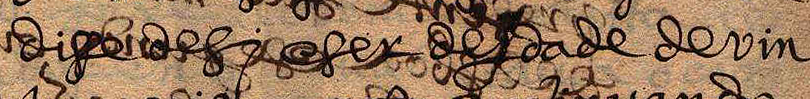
disse de sj e ser de jdade de vin
